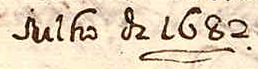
Iulho de 1682
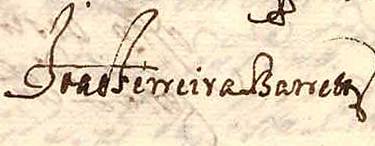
Ioaõ Ferreira Barreto
